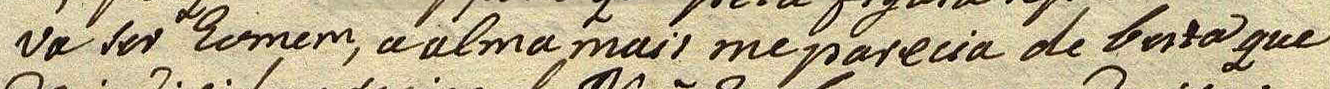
va ser homem, a alma mais me parecia de besta que
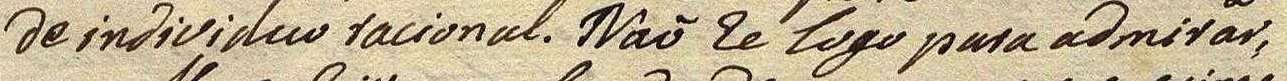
de individuo racional. Naõ he logo para admirar,
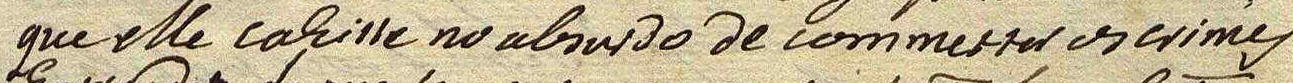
que elle cahisse no absurdo de commetter os crimes
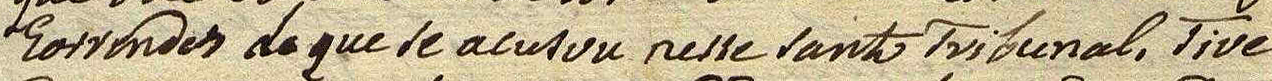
horrendos de que se acusou nesse santo Tribunal. Tive
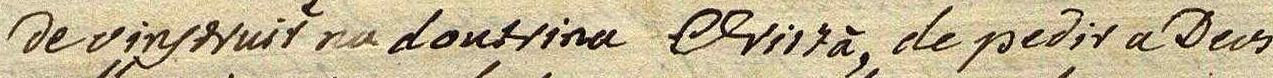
de o instruir na doutrina Christã, de pedir a Deos
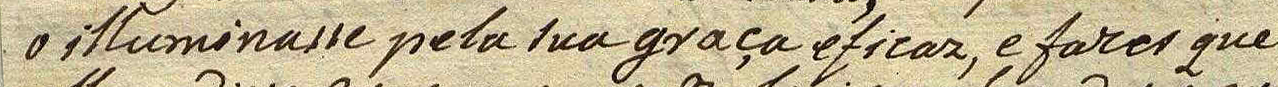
o illuminasse pela sua graça eficaz, e fazer que
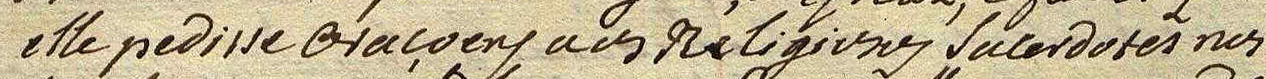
elle pedisse oraçoens aos Religiozos Sacerdotes nos
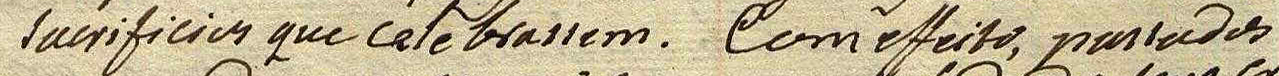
sacrificios que celebrassem. Com effeito, passados
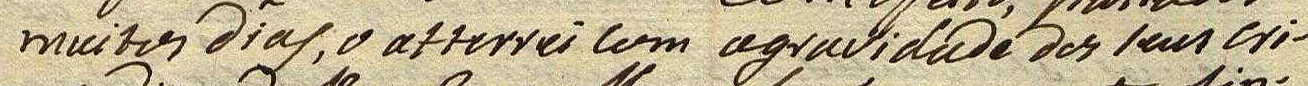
muitos dias, o atterrei com a gravidade dos seus cri
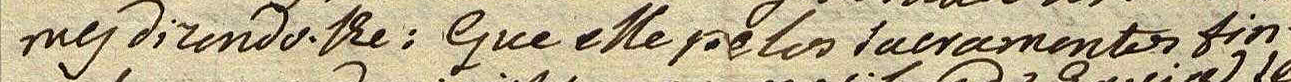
mes dizendo-lhe: Que elle pelos sacramentos fin
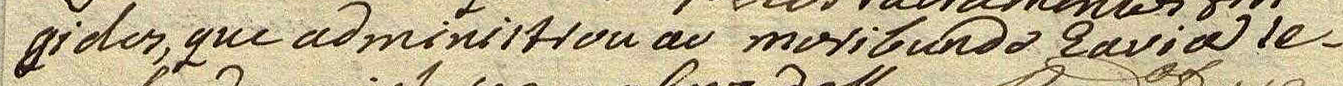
gidos, que administrou ao moribundo havia se
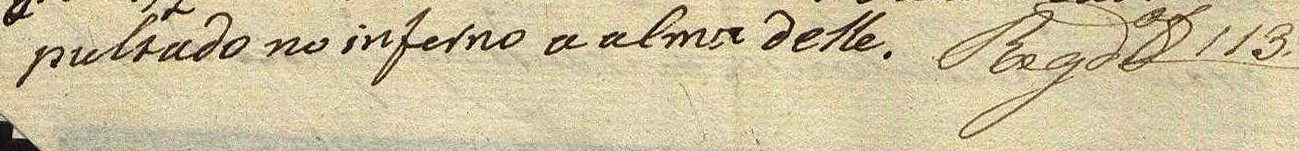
pultado no inferno a alma delle. Regd.o f 113.
